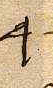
4
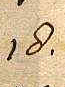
18.
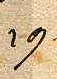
19
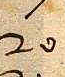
20
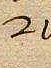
21
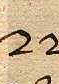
22
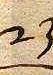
23
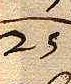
25
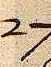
27
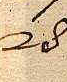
28
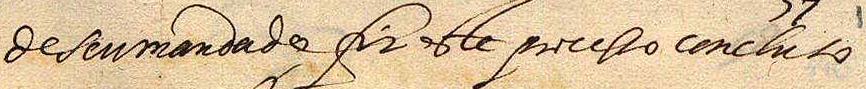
de seu mandado fiz este processo concluzo
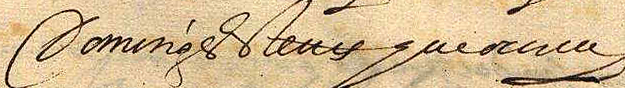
Domingos Esteues que o escreuj
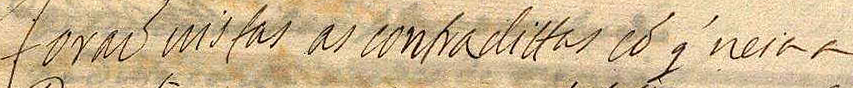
foraõ uistas as contradittas cō q̄ ueio a
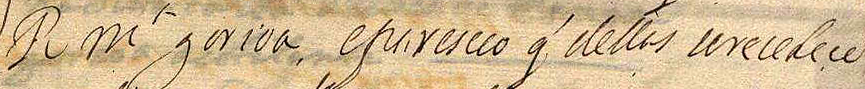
R ma gorioa, e paresceo q̄ dellas se recebecē
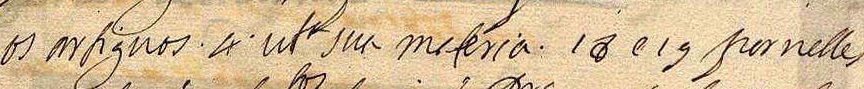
os artiguos .4. uta sua materia. 18 e 19 por nelles
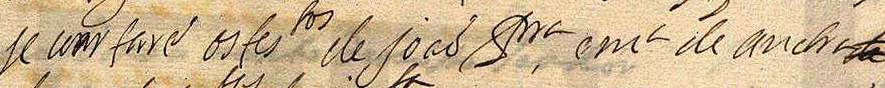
se coartarē os testos de Joaõ Pra, e ma de andrade
